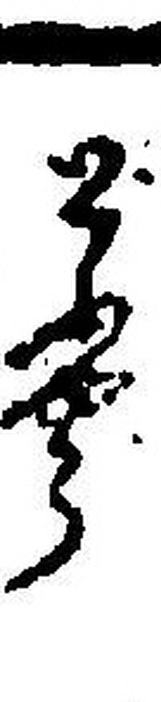とふやら
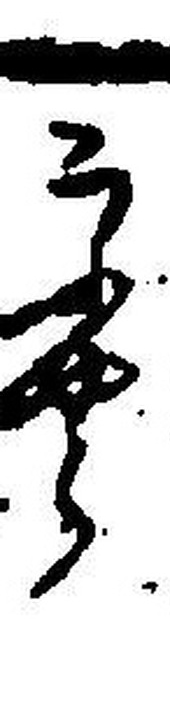こふやら
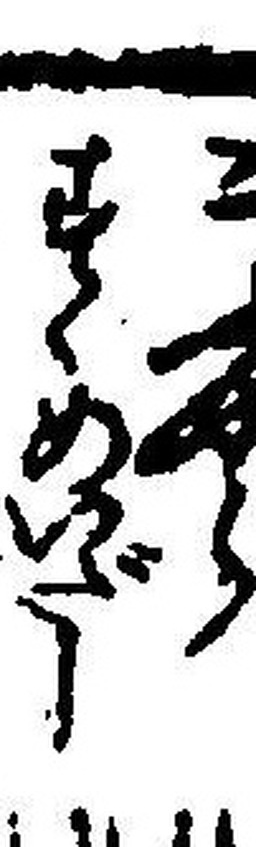すゝめいだし
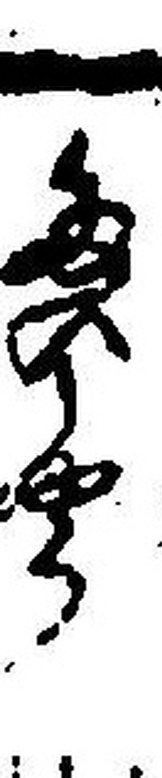たいしやう
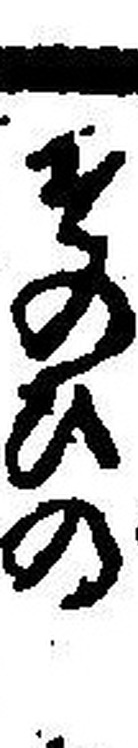そのひの
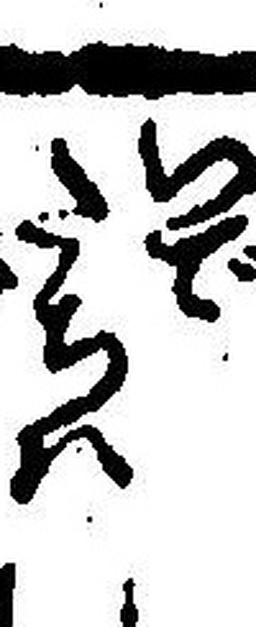たちは
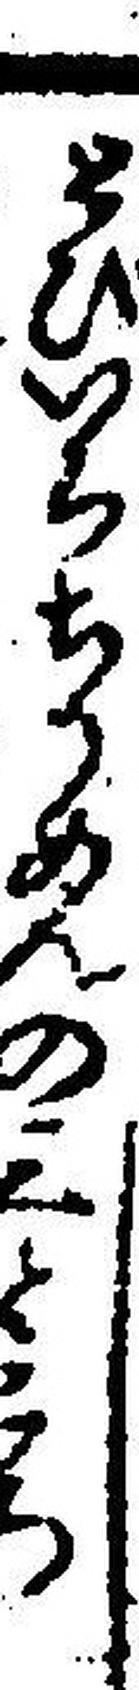とびいろちりめんの三ところ
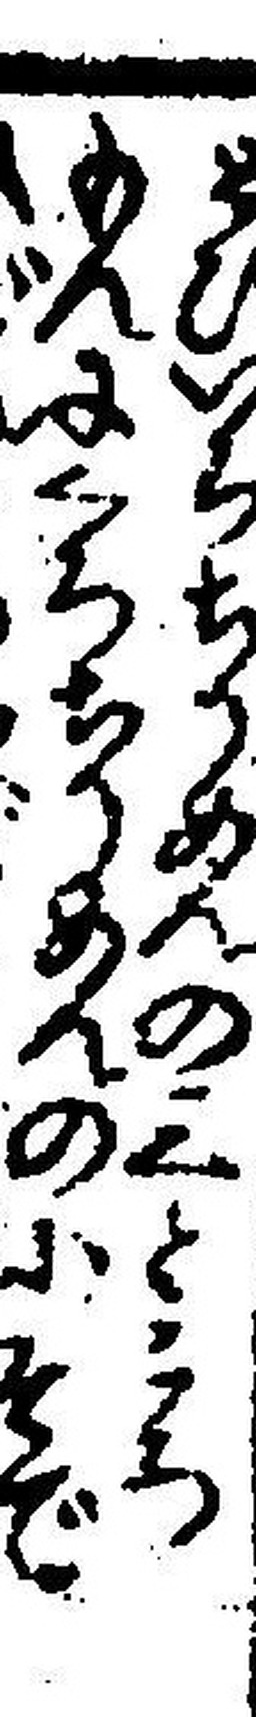もんにくろちりめんの小そで
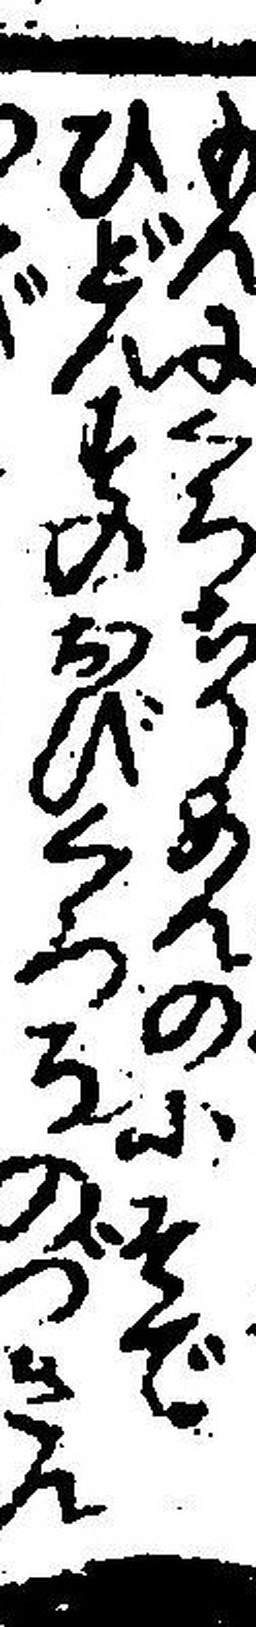ひどんすのおびくろろのづきん
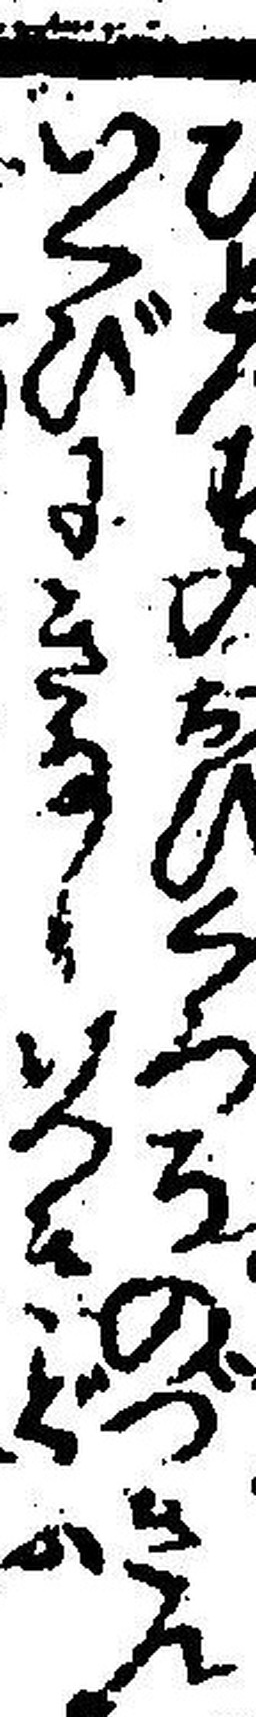いくびにきなしいつきどふ
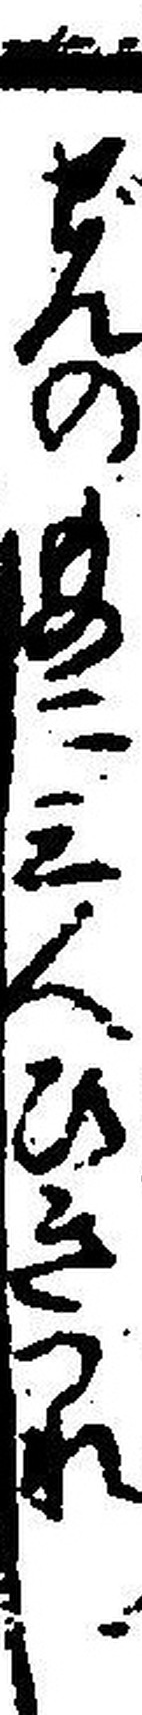ぜんのもの二三人ひきつれ
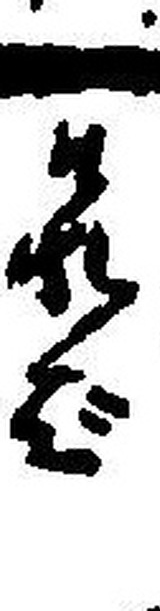ければ
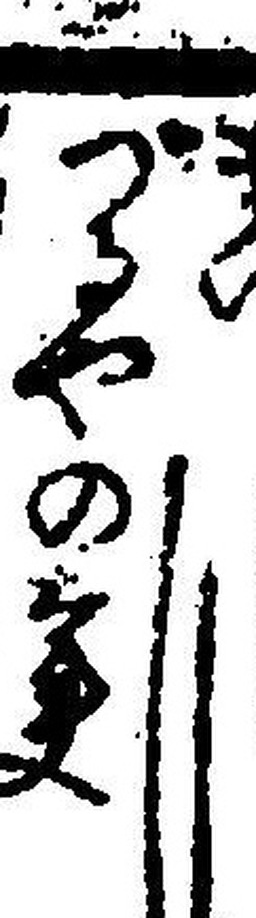づるやの太夫
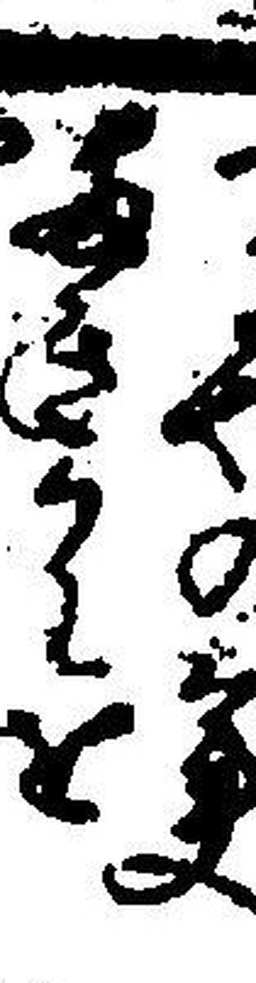たきかわを
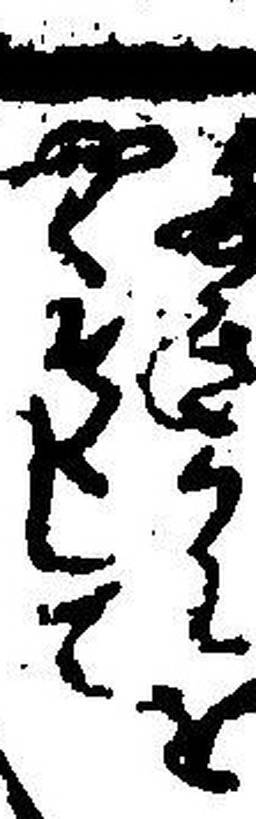やくそくして
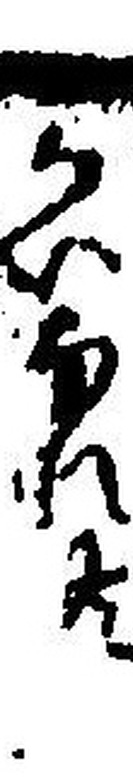かいなれは
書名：御代参牛時詣 / 市場通笑作
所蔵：東京大学総合図書館 General Library in the University of Tokyo, JAPAN
